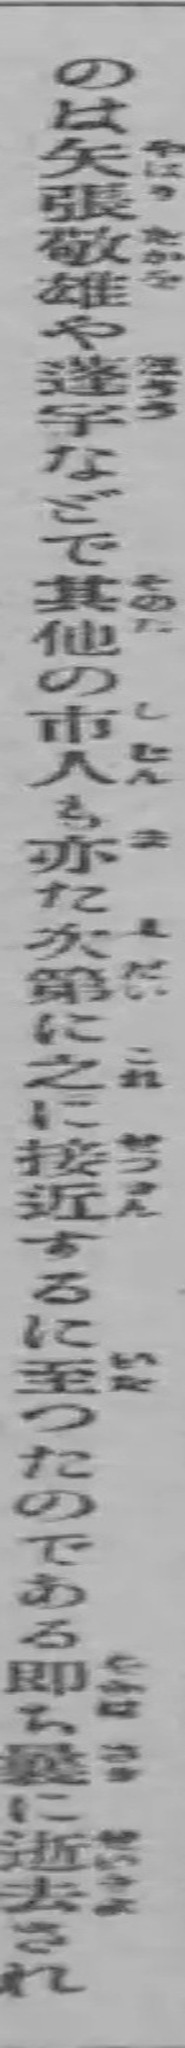のは矢張敬雄や蓬宇などで其他の市人も亦た次第に之に接近するに至つたのである即ち曩に逝去され
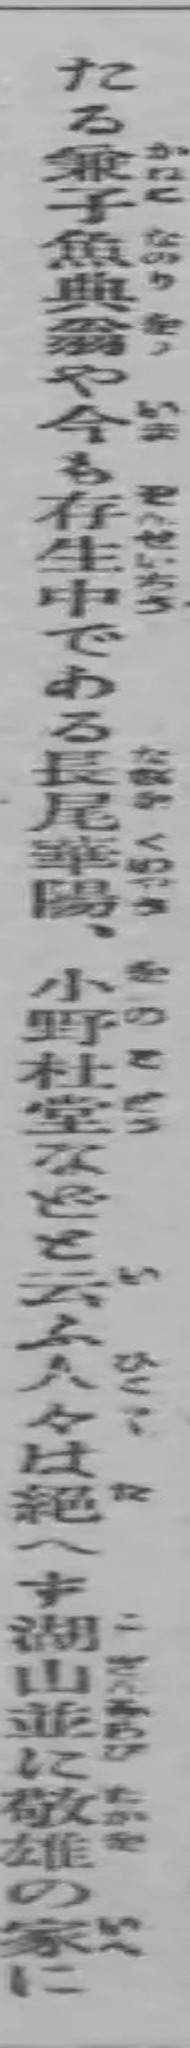たる兼子魚典翁や今も存生中である長尾華陽、小野杜堂などと云ふ人々は絶へず湖山並に敬雄の家に
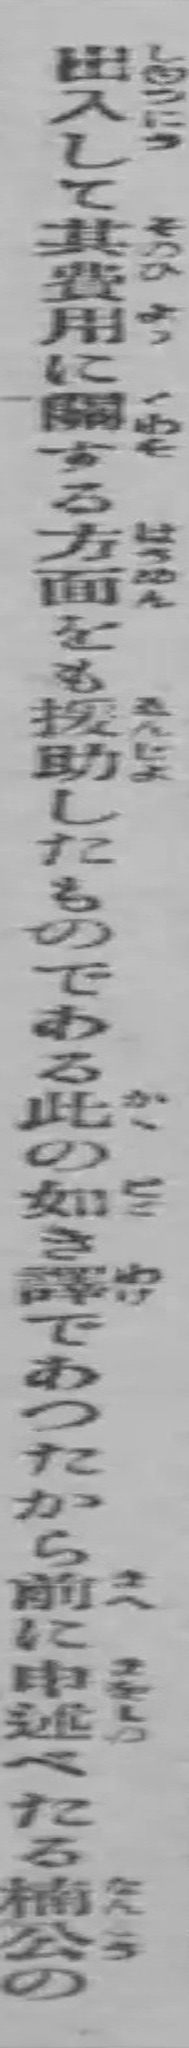出入して其費用に関する方面をも援助したものである此の如き訳であつたから前に申述べたる楠公の
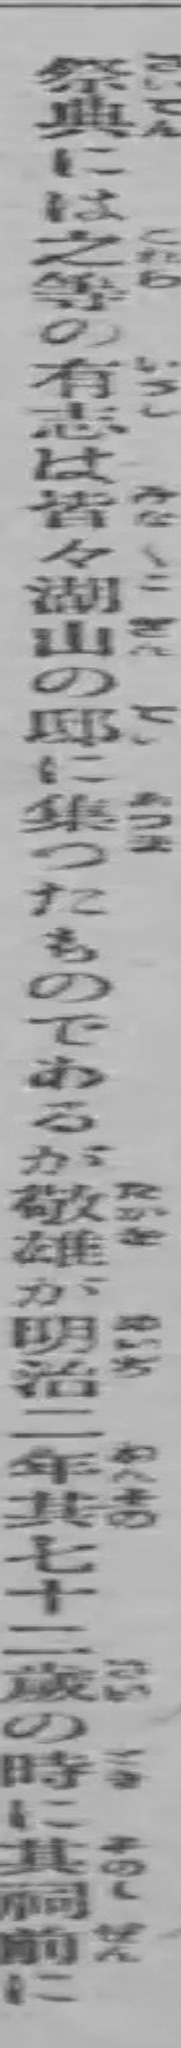祭典には之等の有志は皆々湖山の邸に集つたものであるが敬雄が明治二年其七十二歳の時に其祠前に
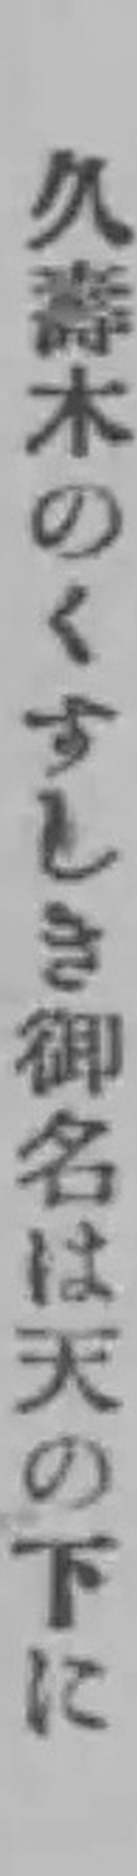久壽木のくすしき御名は天の下に
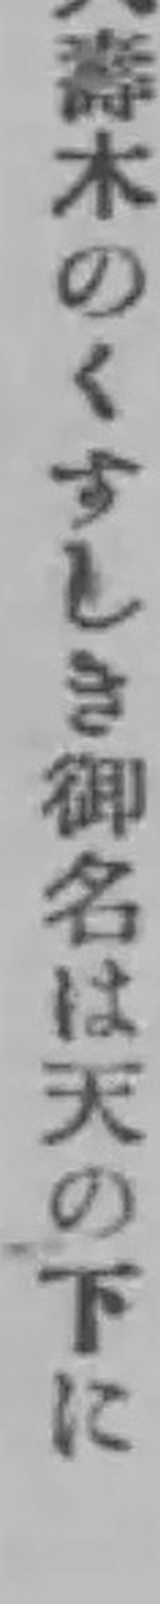久壽木のくすしき御名は天の下に
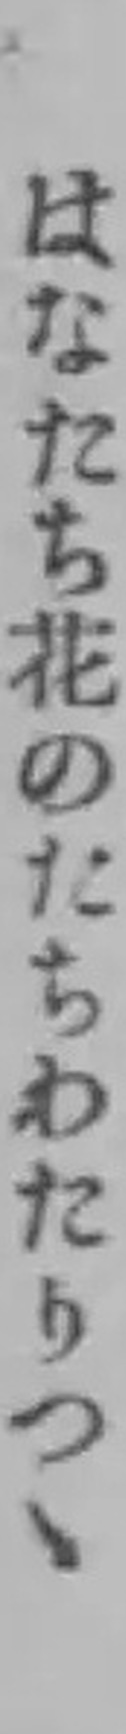はなたち花のたちわたりつゝ
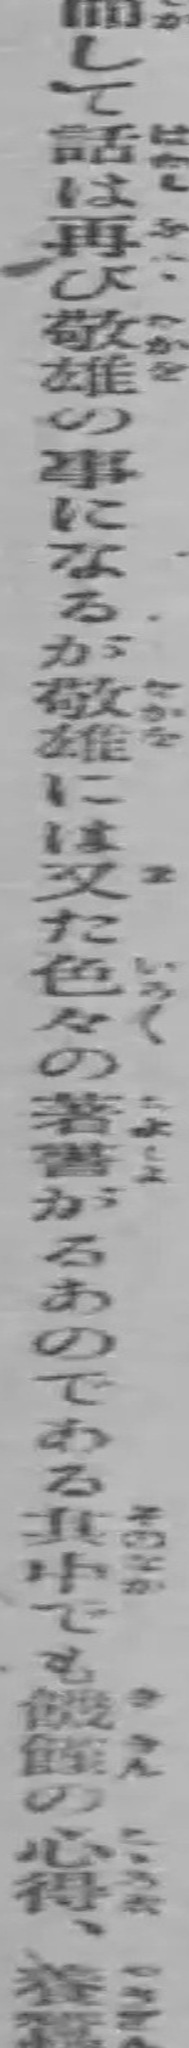而して話は再び敬雄の事になるが敬雄には又た色々の著書があるのである其中でも飢饉の心得、養蠶

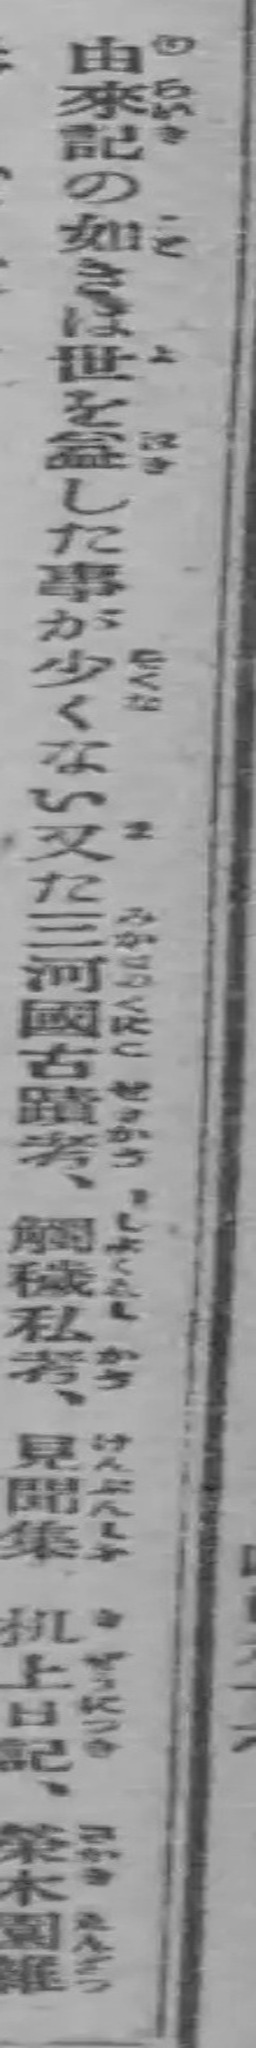由来記の如きは世を益した事が少くない又た三河国古蹟考、触穢私考、見聞集、机上日記、栄木園雑
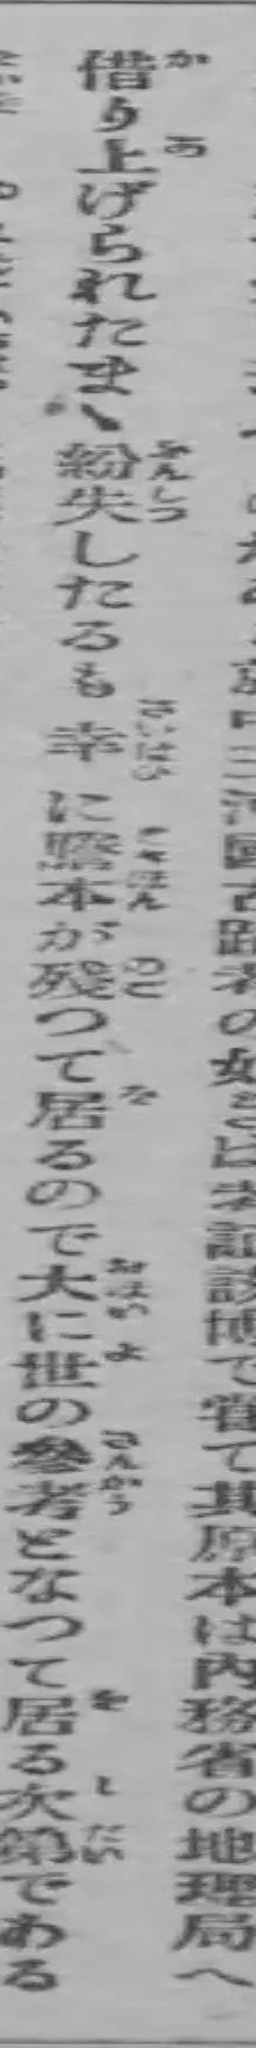借り上げられたまゝ紛失したるも幸に謄本が残つて居るので大に世の参考となつて居る次第である
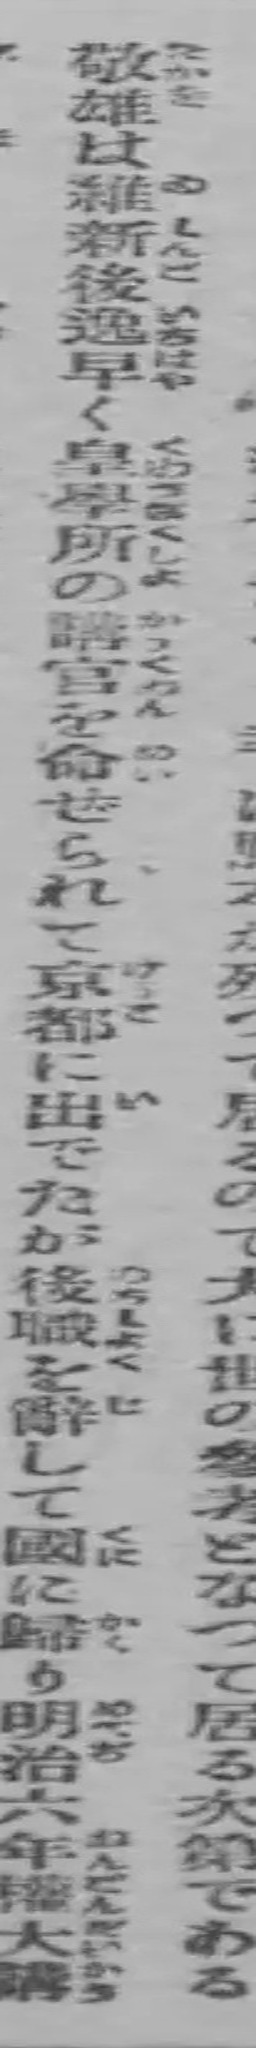敬雄は維新號逸早く皇学所の講官を命ぜられて京都に出でたが後職を辞して国に帰り明治六年権大講
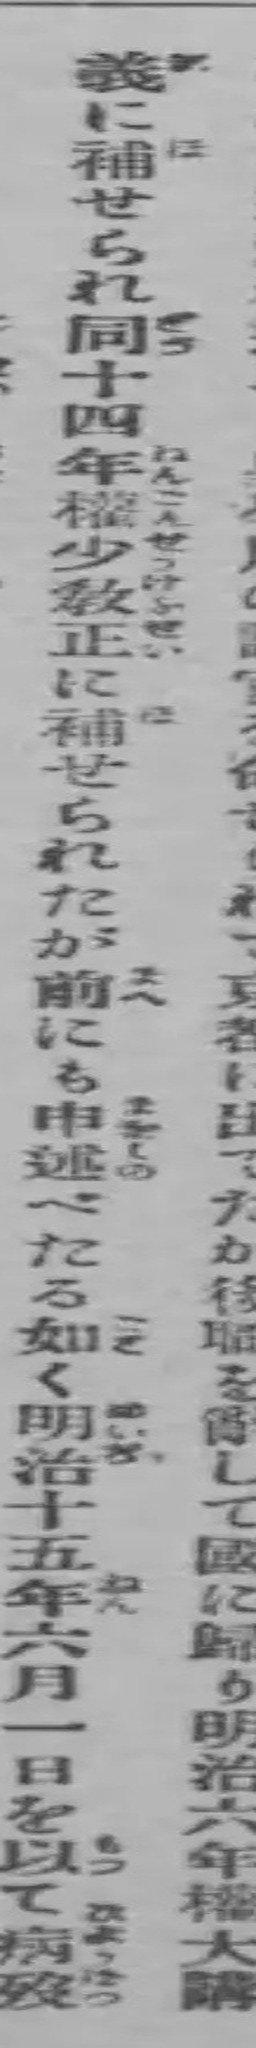義に補せられ同十四年権少教正に補せられたが前にも申述べたる如く明治十五年六月一日を以て病歿
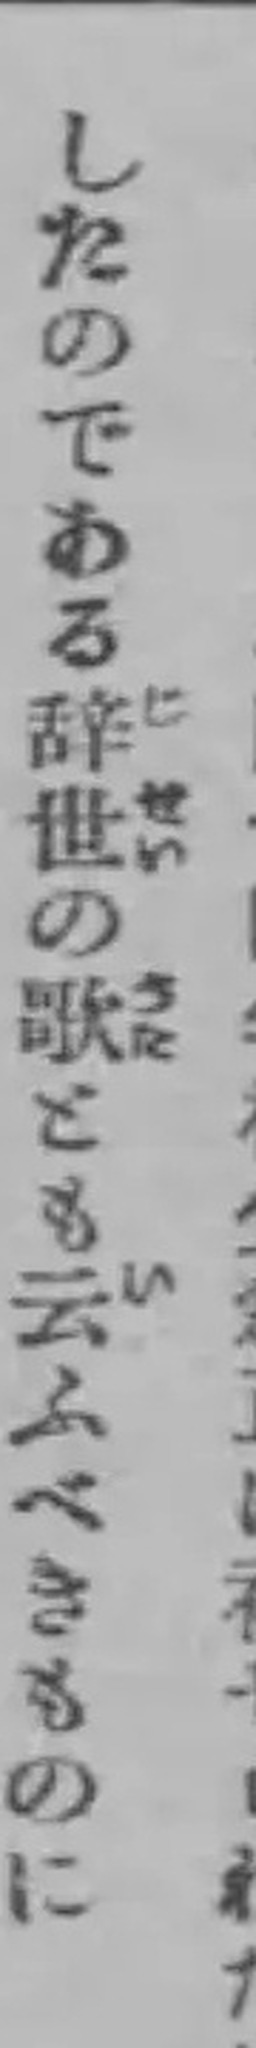したのである辞世の歌とも云ふべきものに
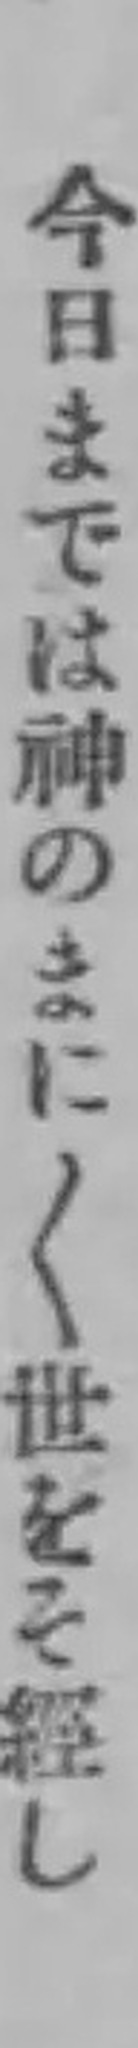今日までは神のまに〳〵世をそ経し
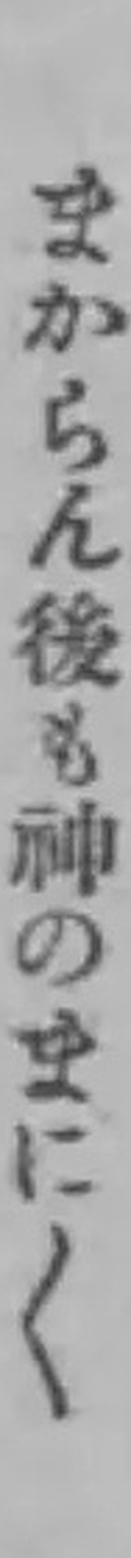まからん後も神のまに〳〵
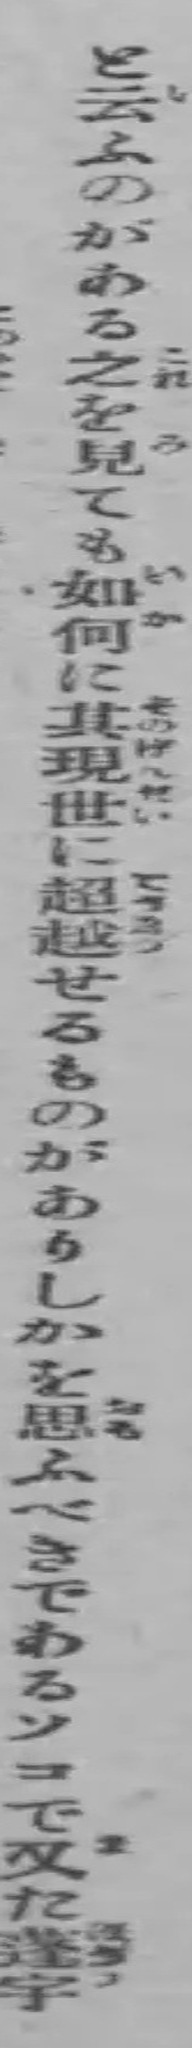と云ふのがある之を見ても如何に其現世に超越せるものがありしかを思ふべきであるソコで又た蓬宇
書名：豊橋市史談
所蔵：国立国会図書館 National Diet Library, JAPAN
